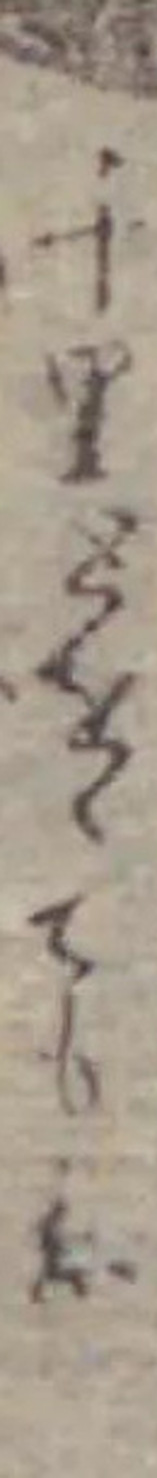千里とをくても
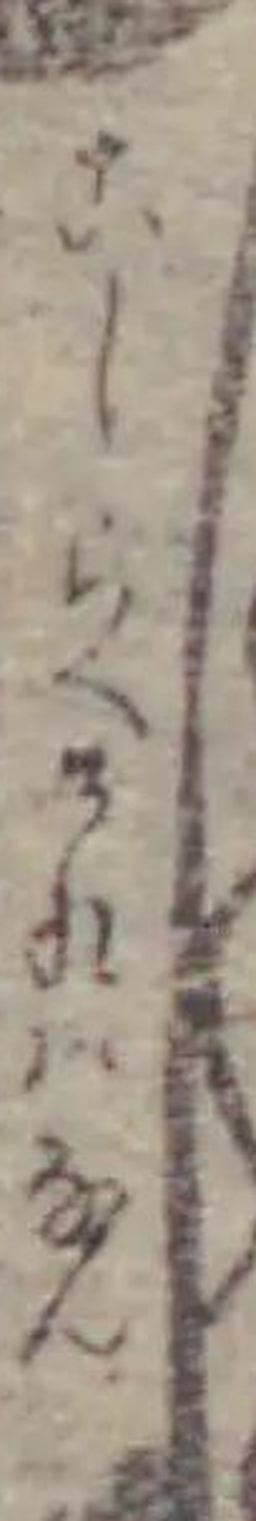こしらへけれはなん
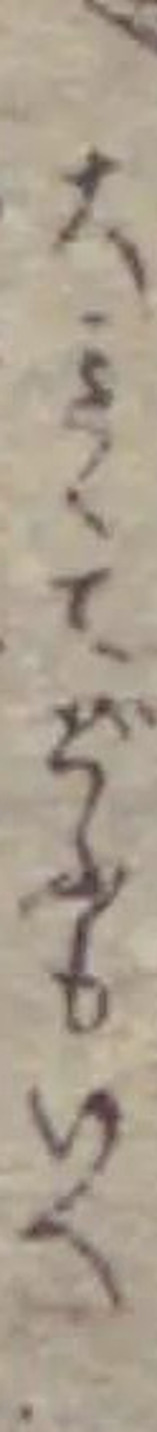大きくてどふもいへ
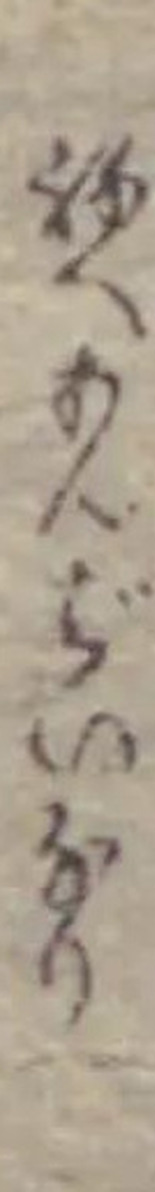ねへあんばいなり

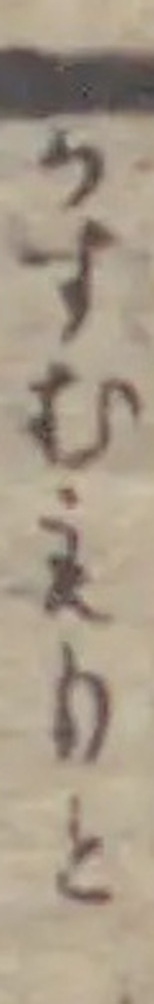かすむももと
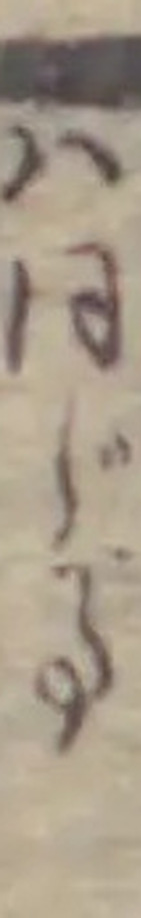は同じ事
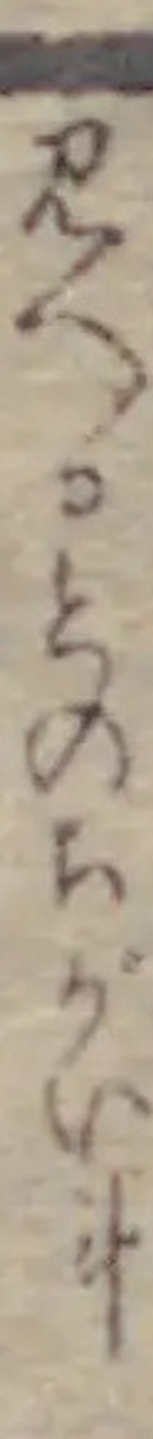見へるとのちがい計
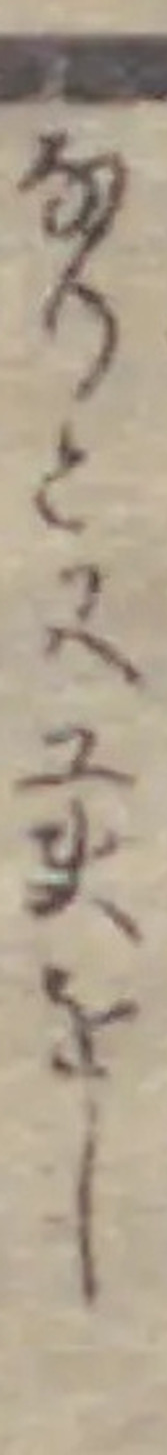なりと又工夫をし
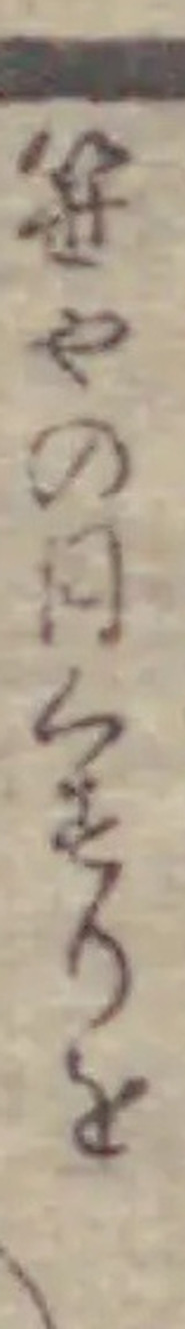笹やの目くすりを
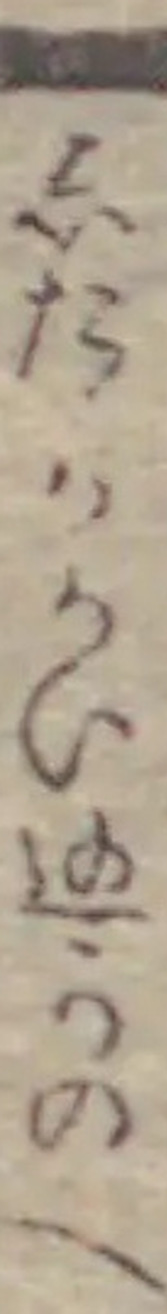したゝかかい込かの
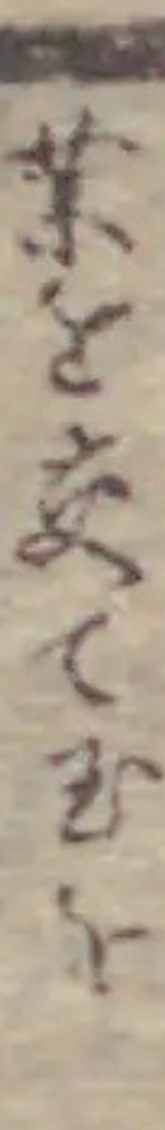薬を交て玉を
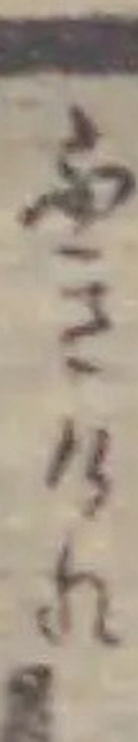ふきけれ
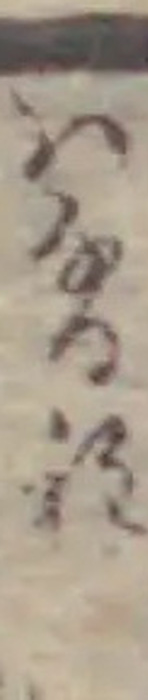はなる程
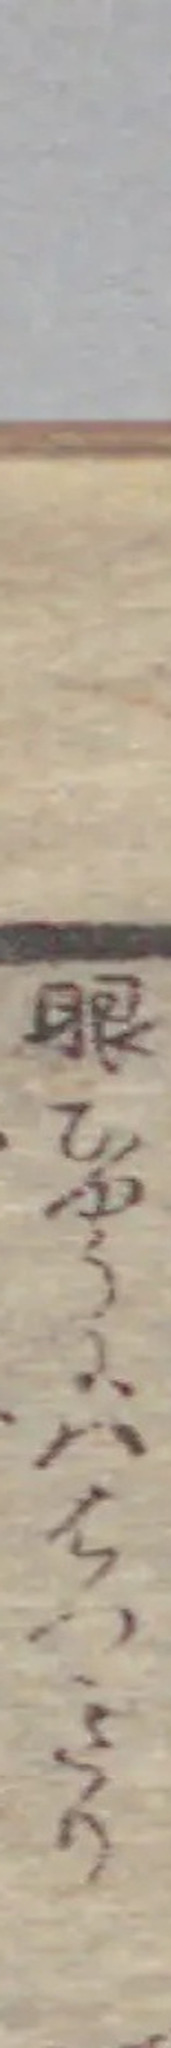眼ひやうにははつきり
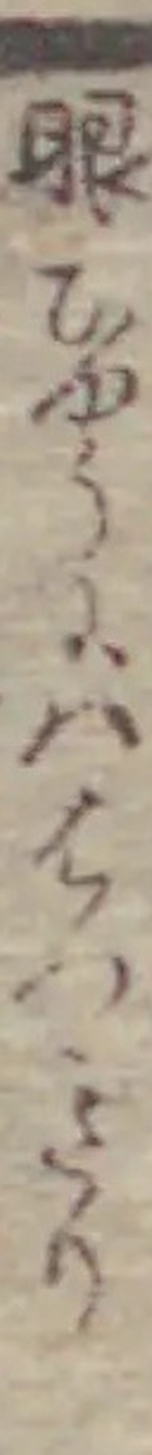眼ひやうにははつきり
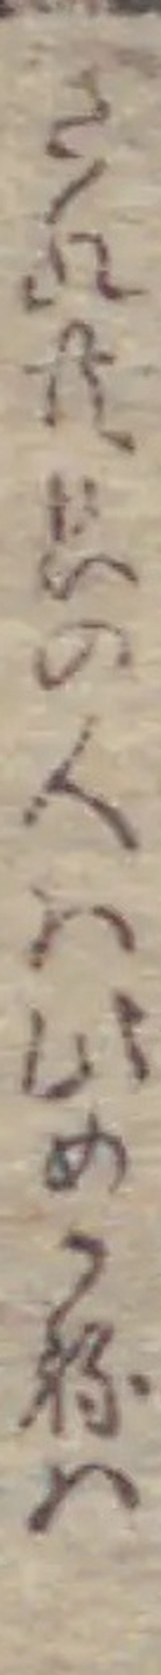され共只の人は此めかねは
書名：栄増眼鏡徳 3巻
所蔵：国立国会図書館 National Diet Library, JAPAN
